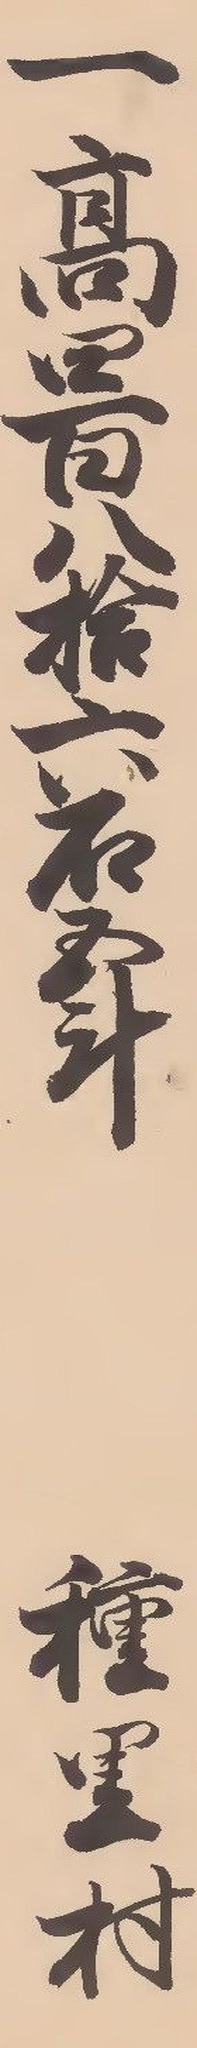一高四百八拾六石五斗種里村
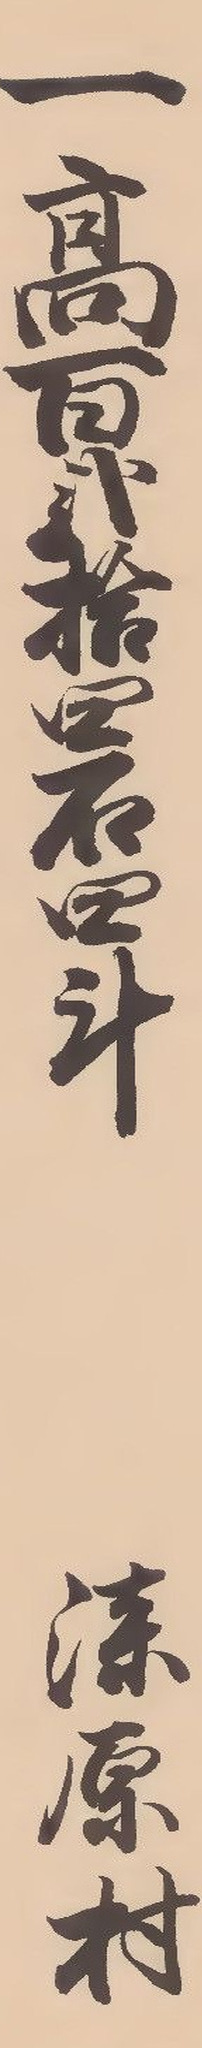一高百弐拾四石四斗漆原村
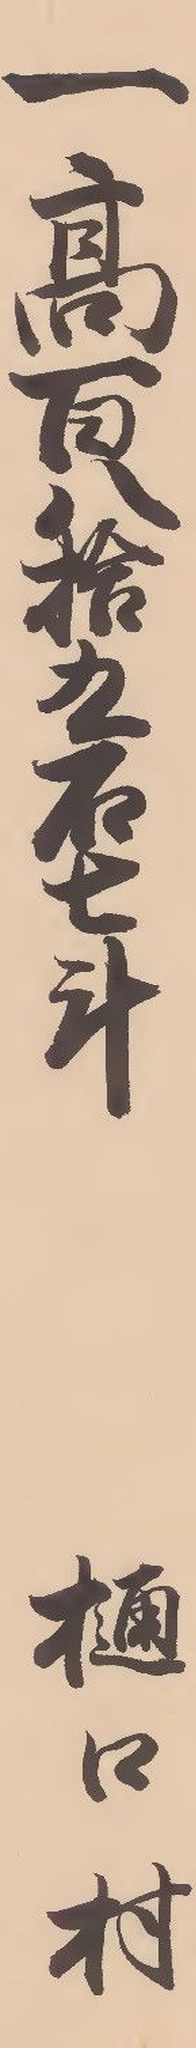一高百八拾九石七斗樋口村
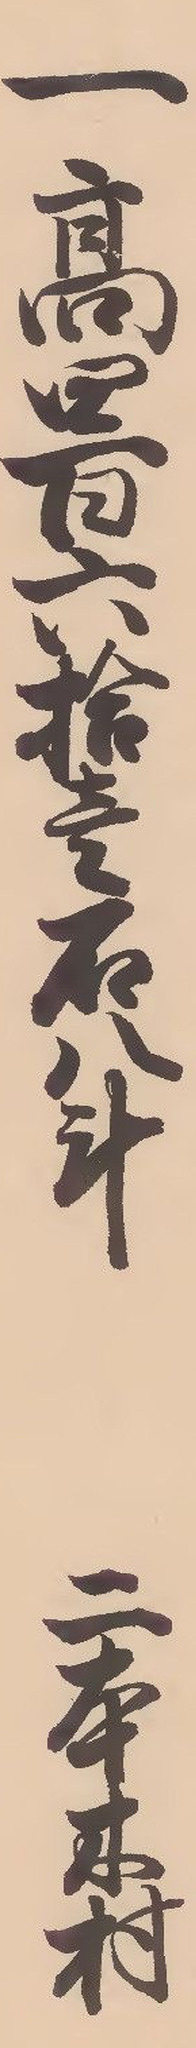一高四百六拾壱石八斗二本木村

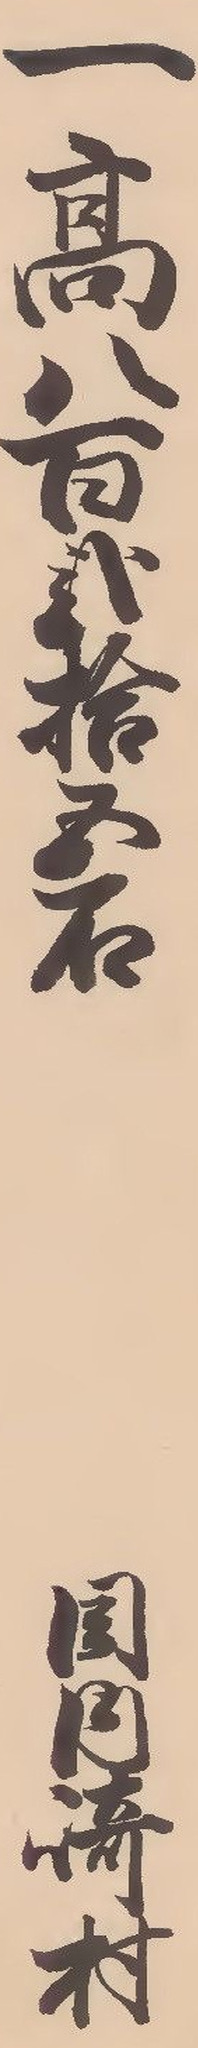一高八百弐拾五石目内崎村
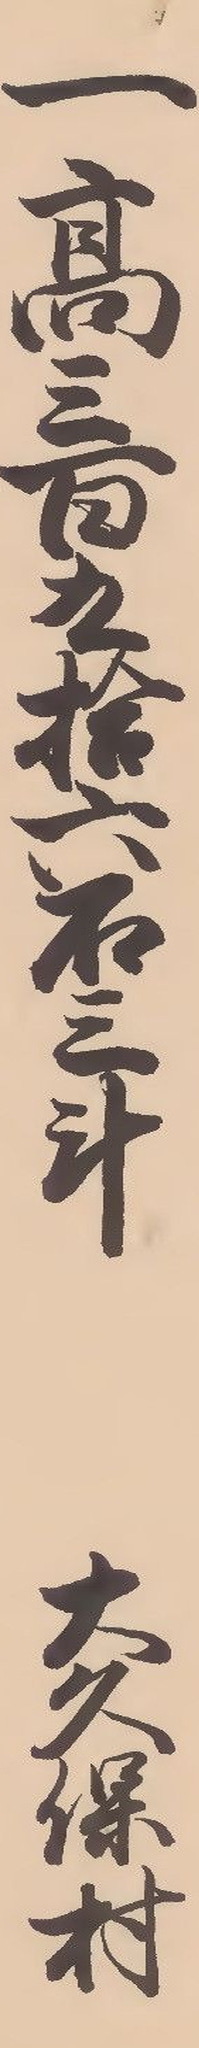一高三百九拾六石三斗大久保村
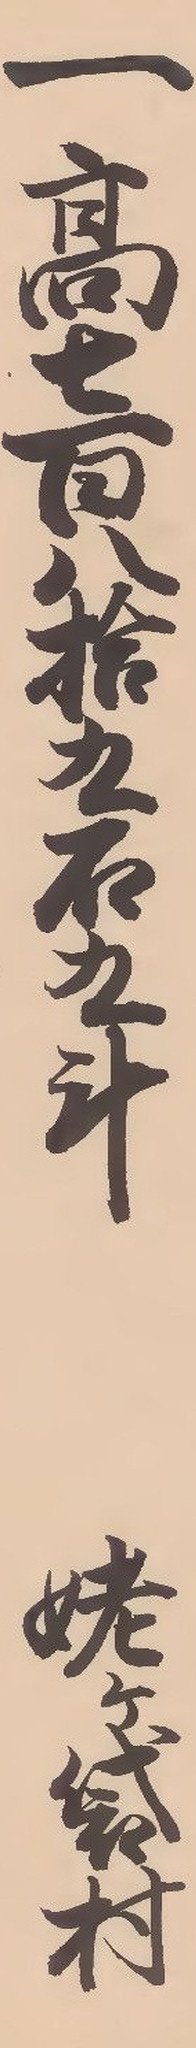一高七百八拾九石九斗姥ケ袋村
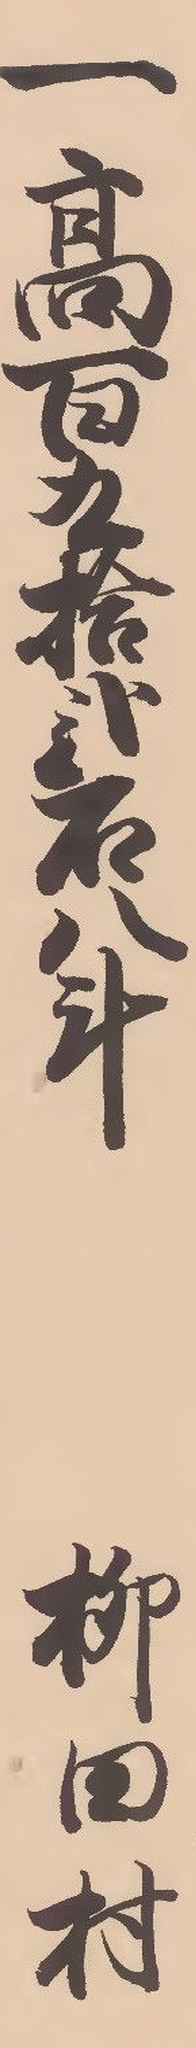一高百九拾弐石八斗柳田村
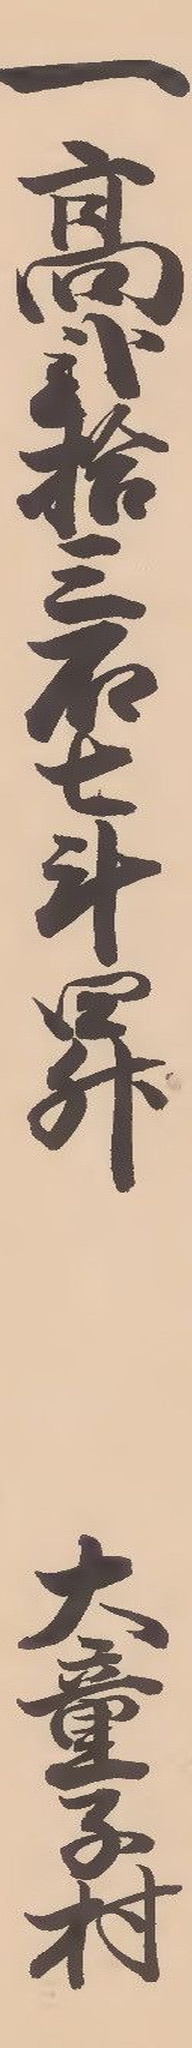一高弐拾三石七斗四升大童子村
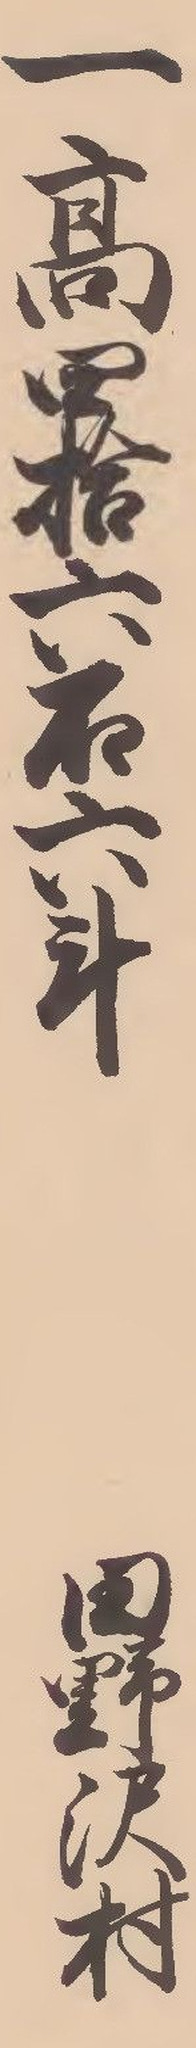一高四拾六石六斗田野沢村

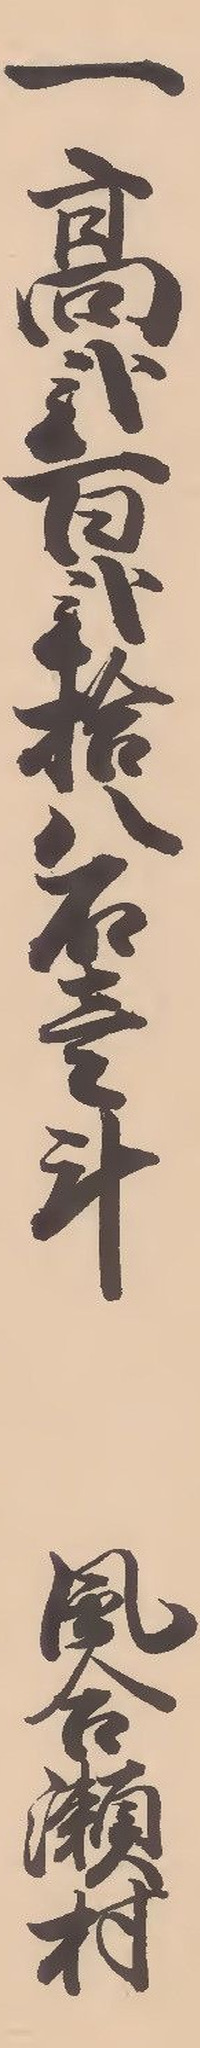一高弐百弐拾八石壱斗風合瀬村
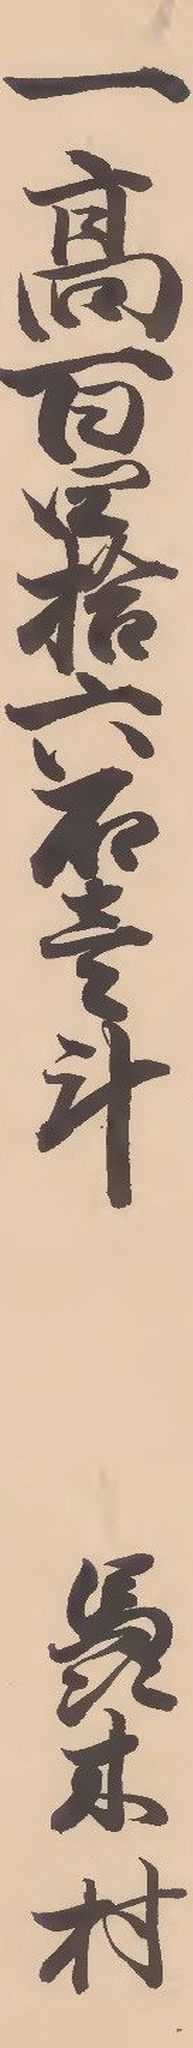一高百四拾六石壱斗驫木村
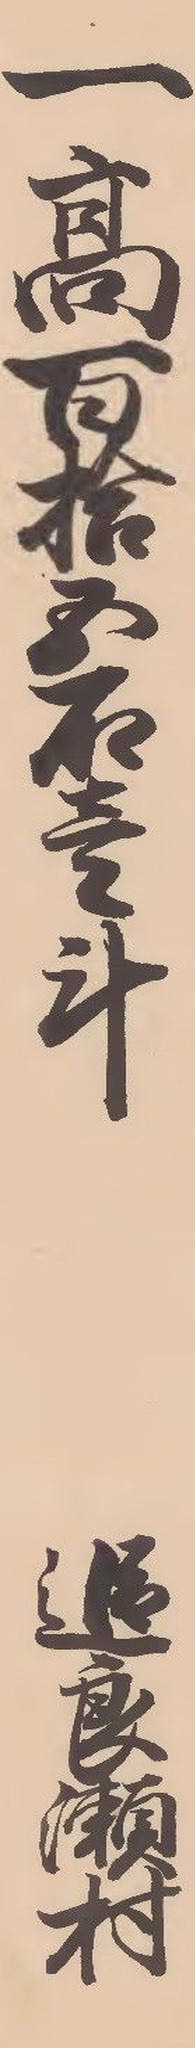一高百拾五石壱斗追良瀬村
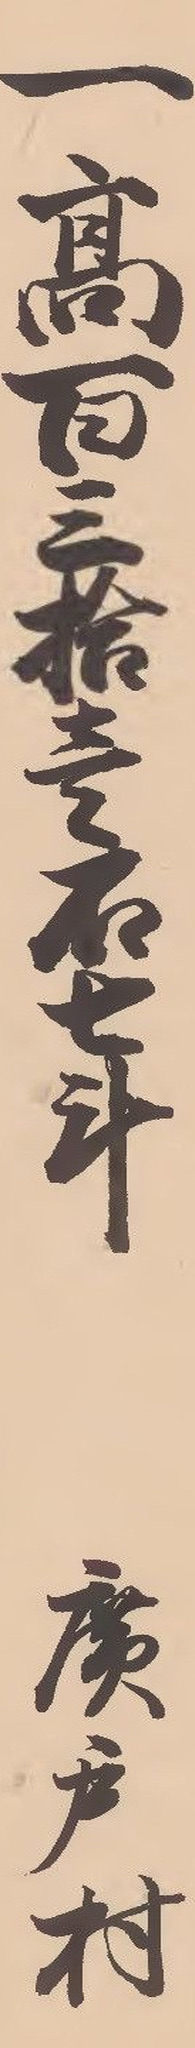一高百三拾壱石七斗広戸村
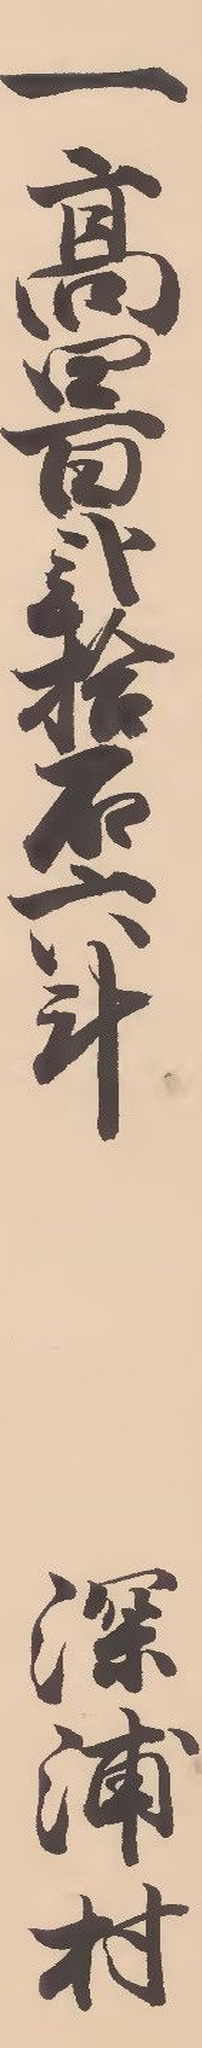一高四百弐拾石六斗深浦村
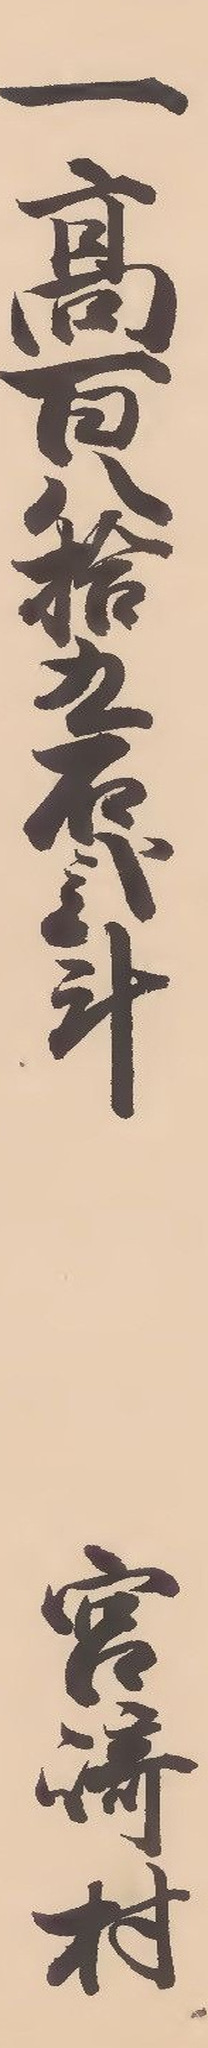一高百八拾九石弐斗宮崎村
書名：陸奥国郷帳　７
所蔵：国立公文書館 National Archives of Japan
